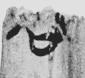者
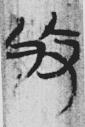收
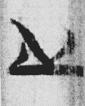之
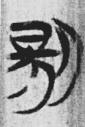剔（傷）
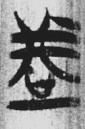者
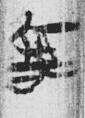䎽（問）
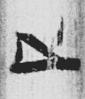之
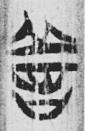善
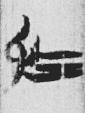於
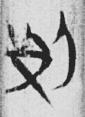死
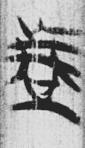者
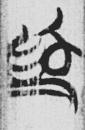爲
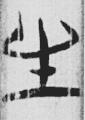生
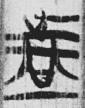者
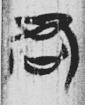君
